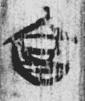合
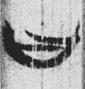曰
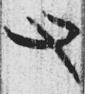又
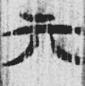亓
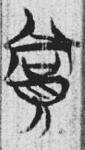賞
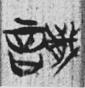○（浅）
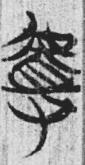○（且）
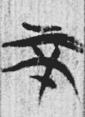不
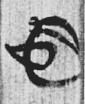𠁩
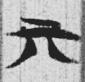亓
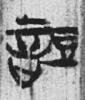{言豆}（诛）
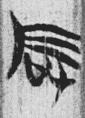度（庶）
